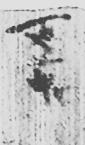五十=
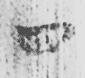四
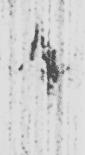千
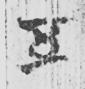五
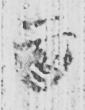百
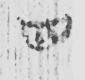四
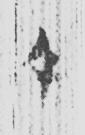千
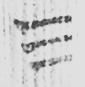三
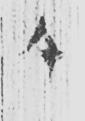千
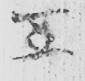五
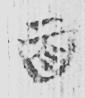百
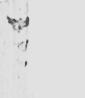三
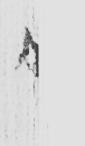千
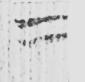二
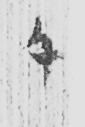千
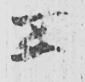五
